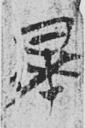○（早）
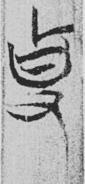○（使）
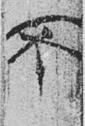不
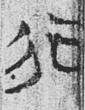行
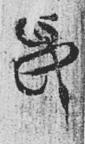妥（綏）
